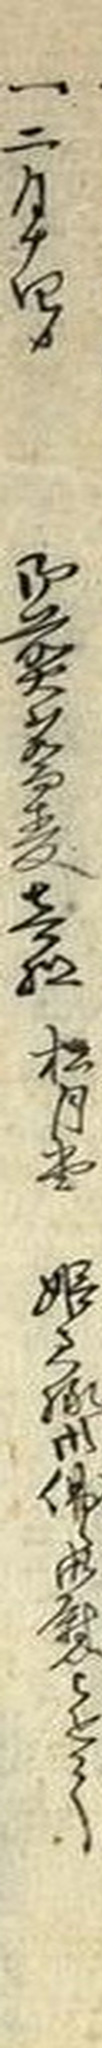一二月十四日御煎蕎麦壱組松月堂姫君様御側御慰被進之
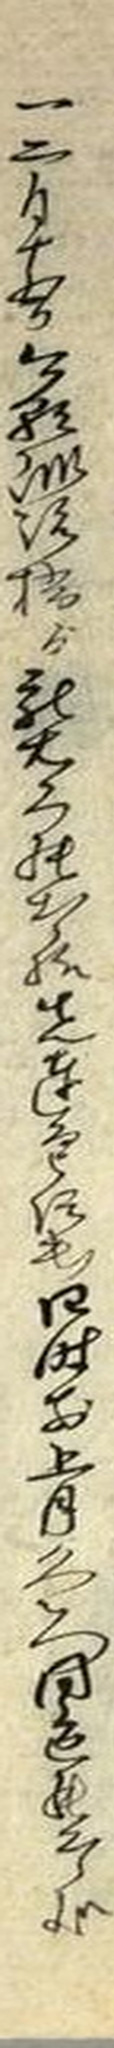一ニ月十五日今朝鍛冶橋ゟ新右衛門罷出候様先達而被仰遣四時前上月久右衛門同道罷出処
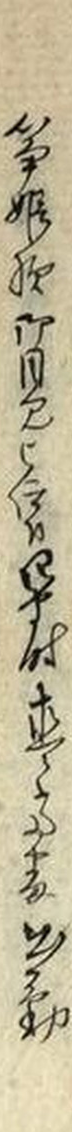箏姫様御目見被仰付候四半時直ニ当番出勤
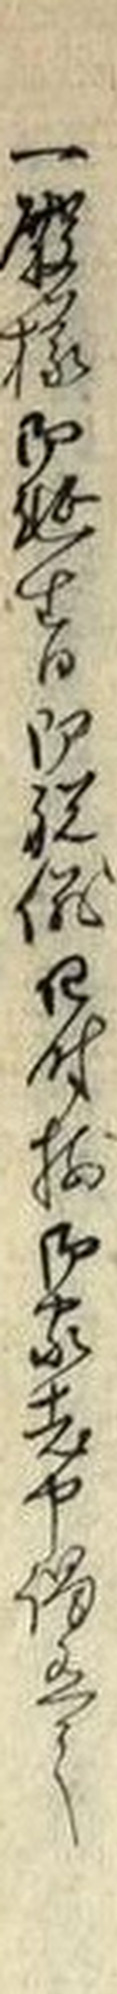一殿様御誕生日御祝儀四時揃御家老中謁有之
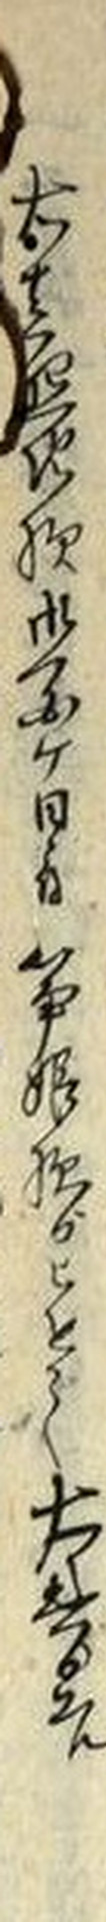右真照院様御百ヶ日ニ付箏姫様ゟ被進之大奥ゟ出ㇽ

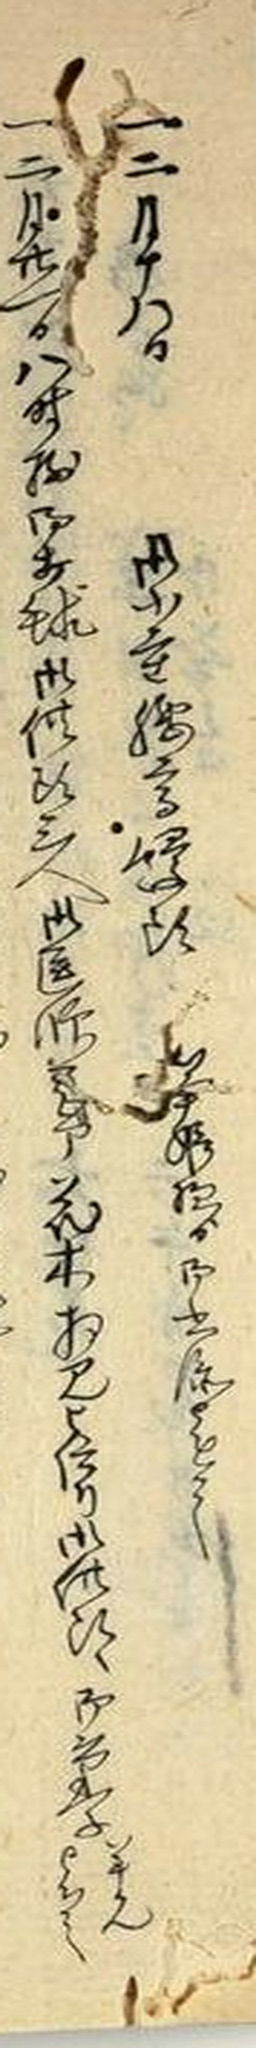一二月廿一日八時揃御打毬御供頭三人御医師岡部花木拝見被仰付御供頭へ御菓子羊かん被下之
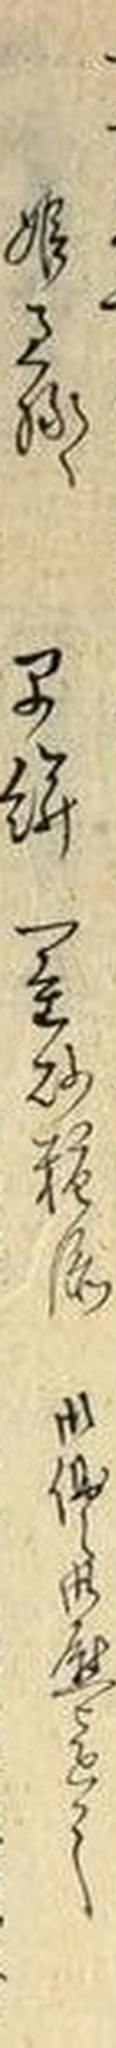姫君様へ草餅一重砂糖添御側之御慰被進之
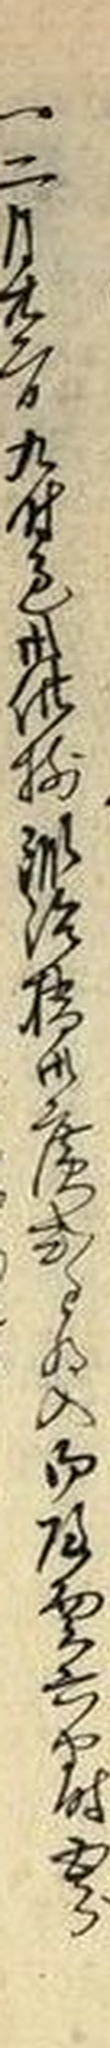一二月廿二日九時過御供揃鍛冶橋御広式へ被為入御帰殿六半時五分
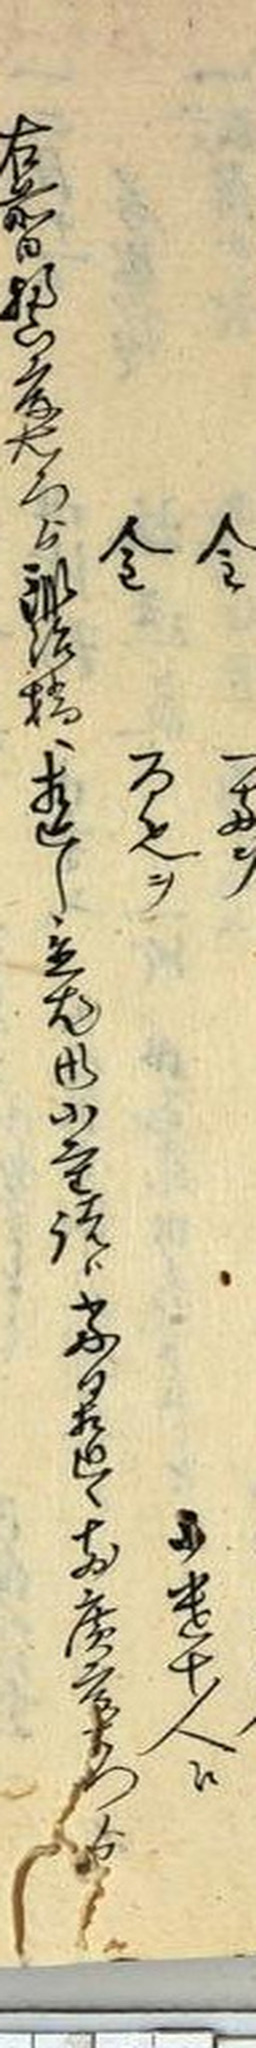右前日福山藤右衛門ゟ鍛冶橋へ相廻し置尤御小重詰ハ当日相廻候前広藤右衛門ゟ
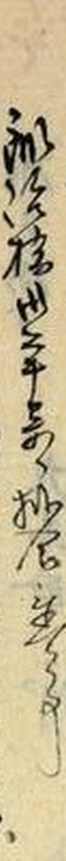鍛冶橋御年寄へ掛合置候事
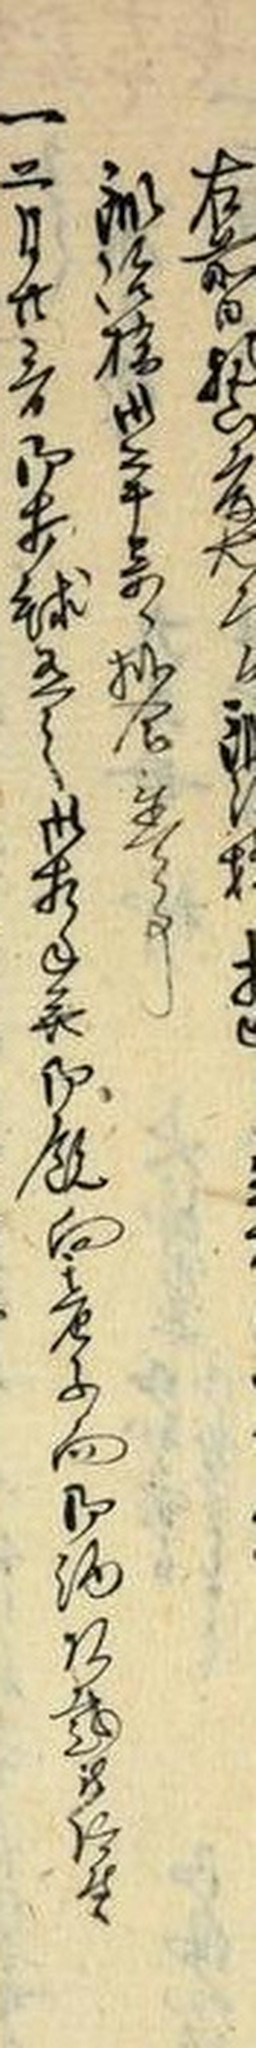一二月廿三日御打毬有之御相手并御厩向台子向御酒頂戴被仰付候
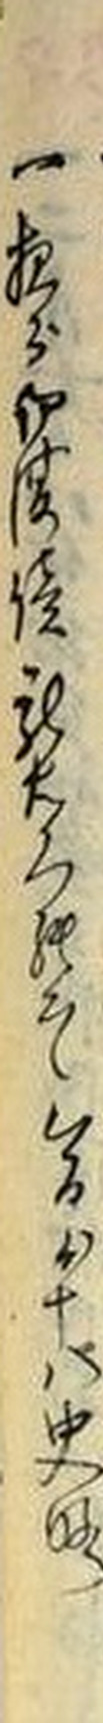夜分御復読新右衛門罷出候今日ゟ十八史略
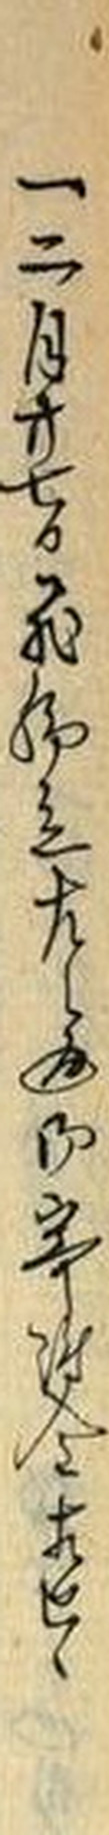一二月廿七日飛脚立左之通御寄附金相廻候
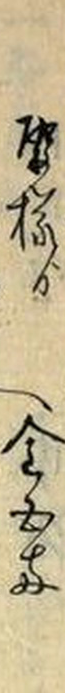殿様ゟ金五両
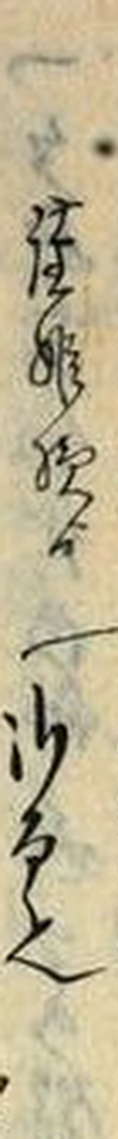謹姫様ゟ弐百疋
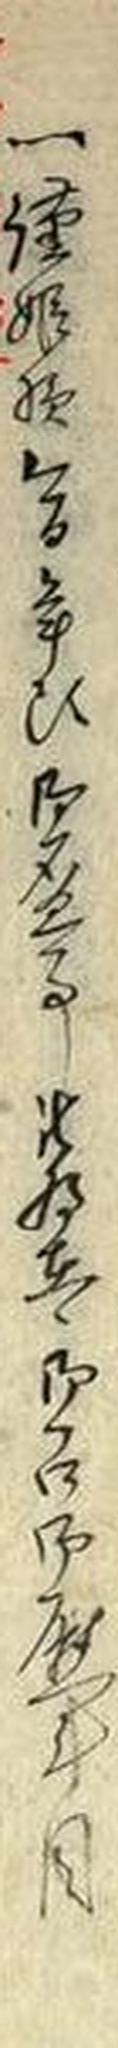一謹姫様今日年頭御盃事被為在候御召御熨斗目
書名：少傅日録抄（斉承付側向頭取日記、在府）
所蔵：福井県文書館 Fukui Prefectural Archives
